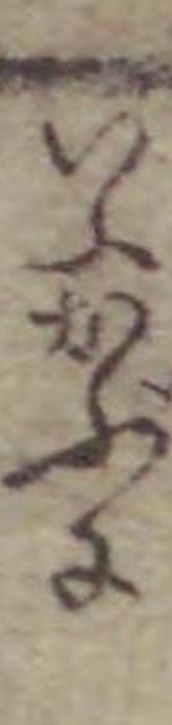いふかぶに
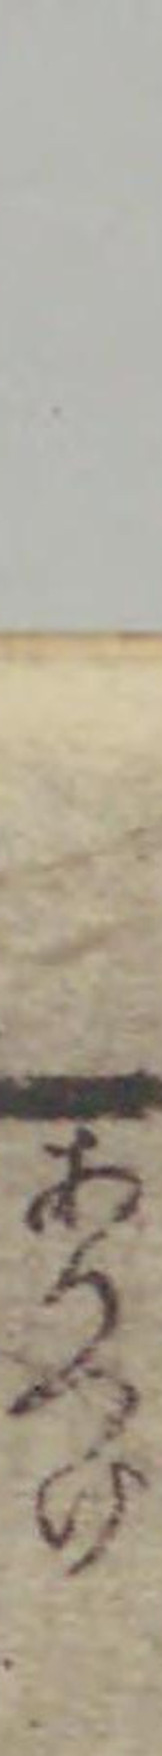ありつけ
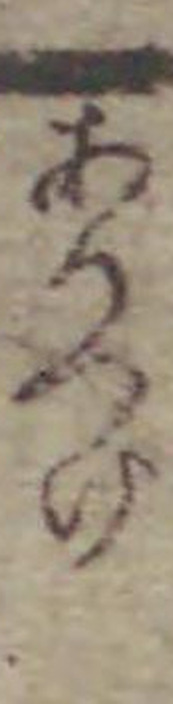ありつけ
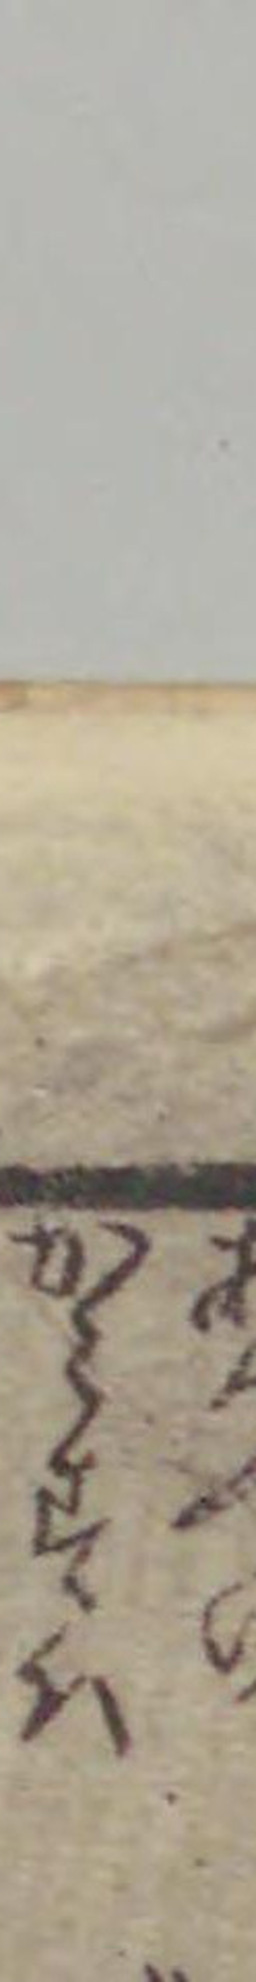からすハ
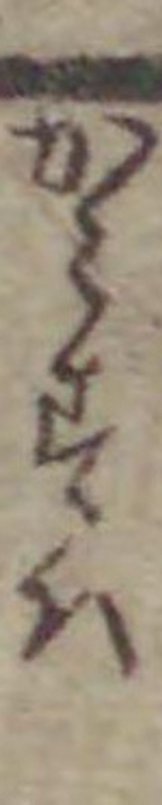からすハ
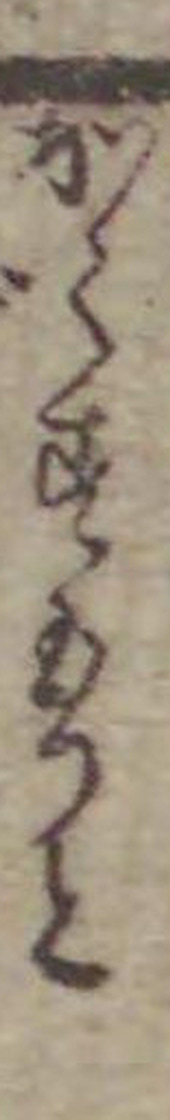からすもりと
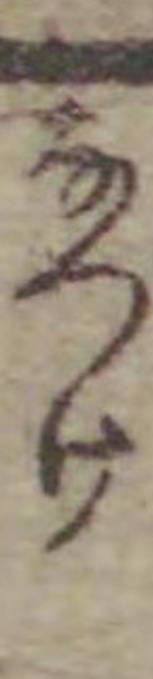なづけ
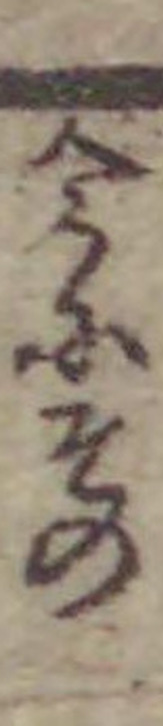今にその
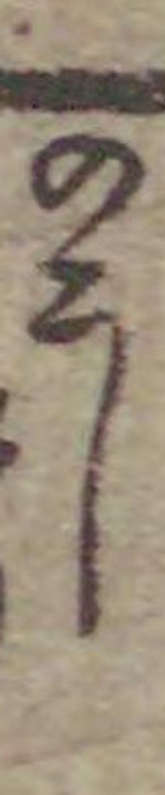のこし

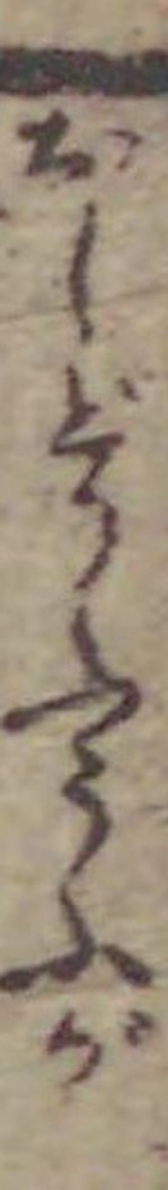おしどりふうふが
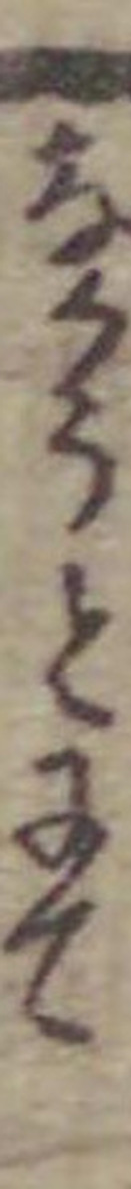なかうとにて
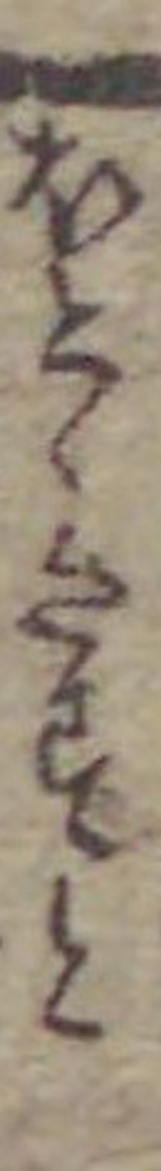ほとゝきすと
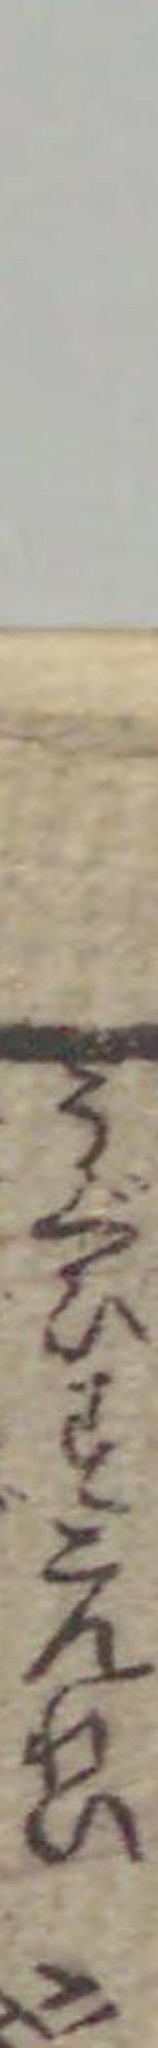うぐひすこんれい
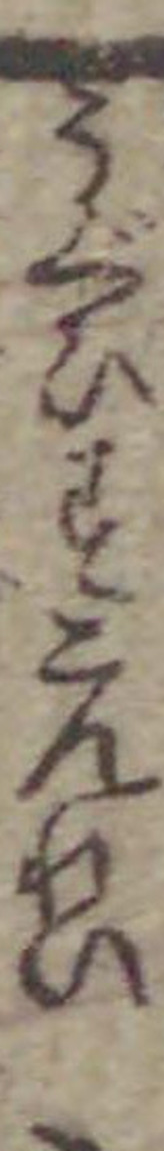うぐひすこんれい
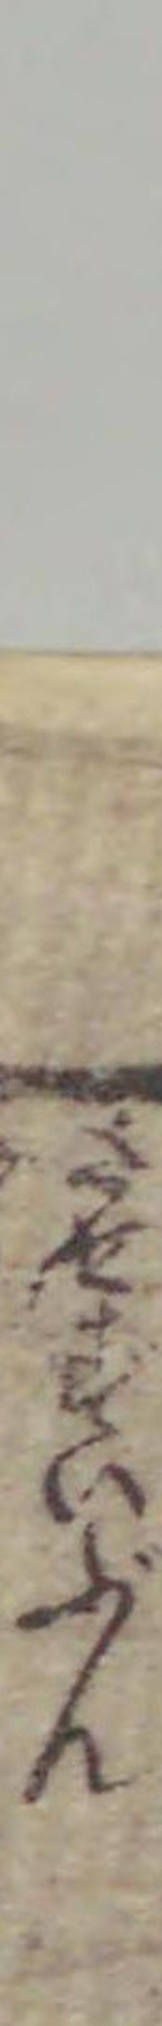させずいぶん
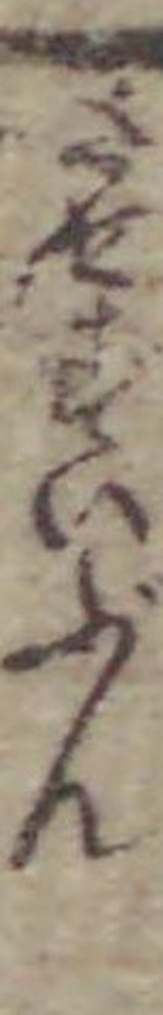させずいぶん
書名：烏行水諺草 3巻
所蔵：国立国会図書館 National Diet Library, JAPAN
